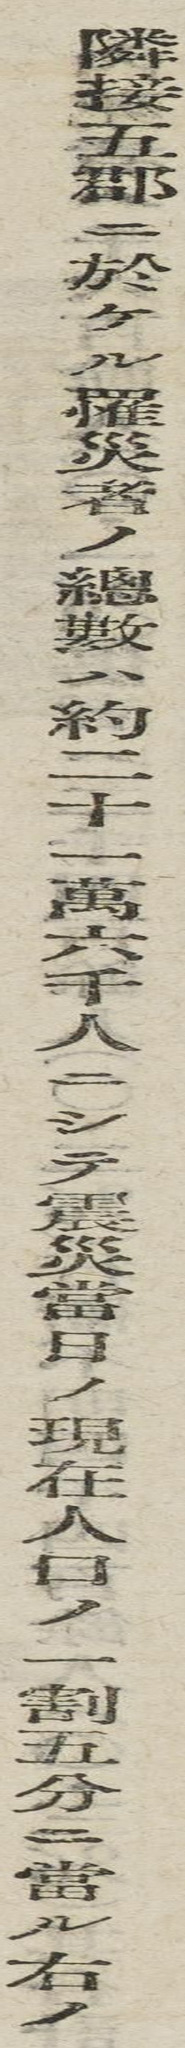隣接五郡ニ於ケル罹災者ノ総数ハ約二十一万六千人ニシテ罹災当日ノ現在人口ノ一割五分ニ当ル右ノ

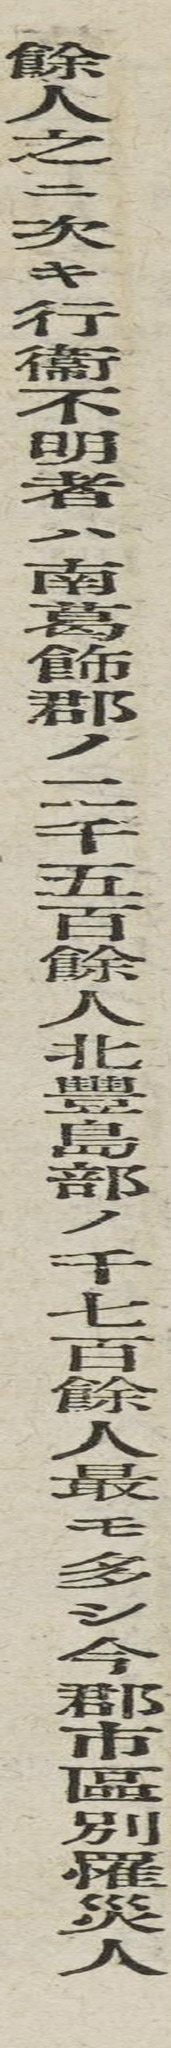余人之ニ次キ行方不明者ハ南葛飾郡ノ二千五百余人北豊島郡ノ千七百余人最モ多シ今郡市区別罹災人
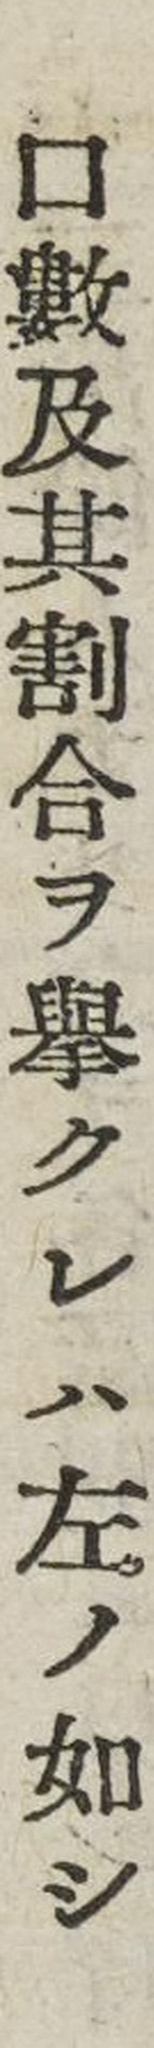口数及其割合を挙クレハ左ノ如シ
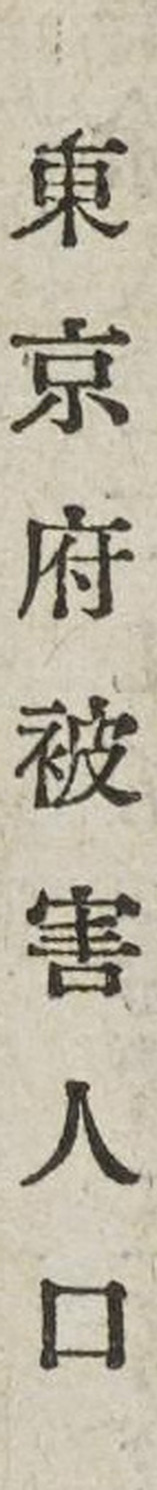東京府被害人口
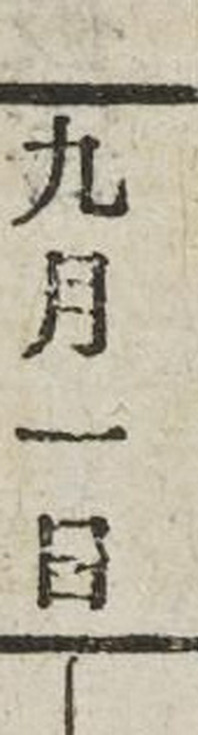九月一日
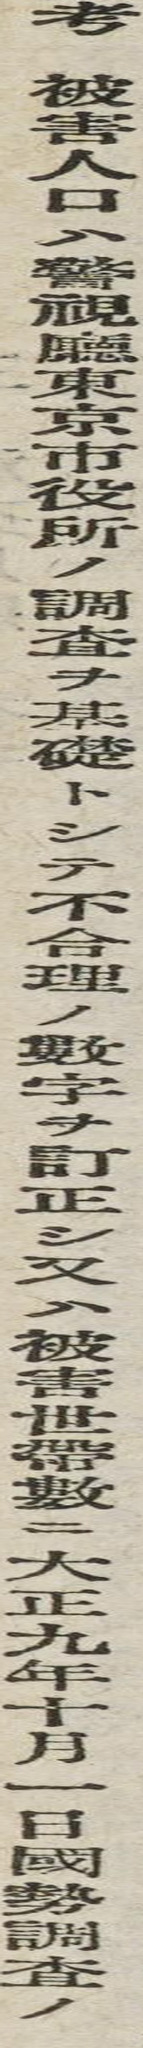備考被害人口ハ警視庁東京市役所ノ調査ヲ基礎トシテ不合理ノ数字ヲ訂正シ又ハ被害世帯数ニ大正九年十月一日国勢調査ノ
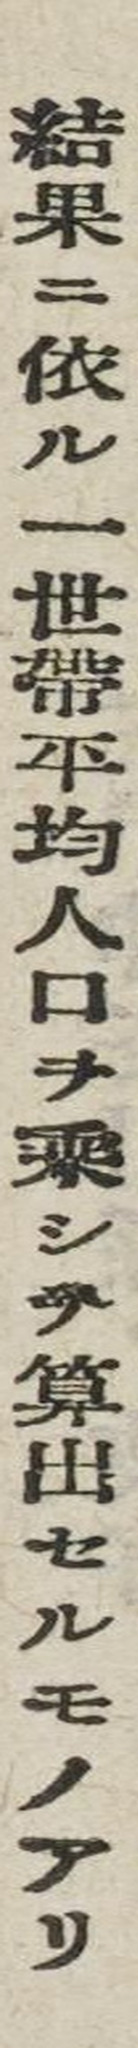結果ニ依ル一世帯平均人口ヲ乗シテ算出セルモノアリ

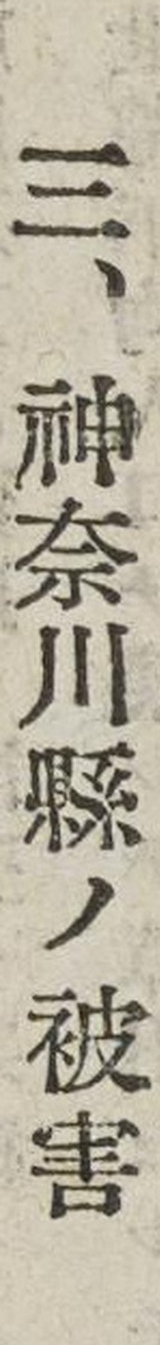三、神奈川県ノ被害
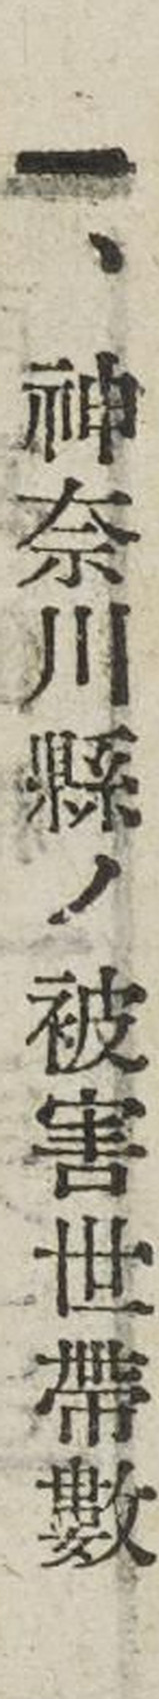一、神奈川県ノ被害世帯数
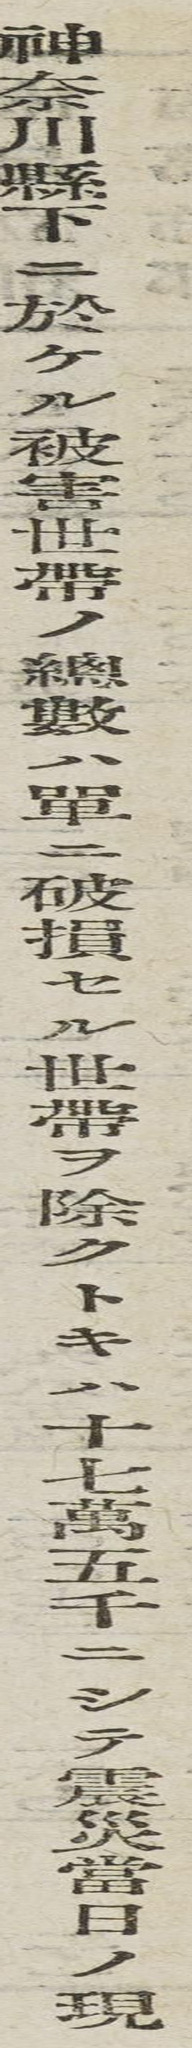神奈川県下ニ於ケル被害世帯ノ総数ハ単ニ破損セル世帯ヲ除クトキハ十七万五千ニシテ震災当日ノ現
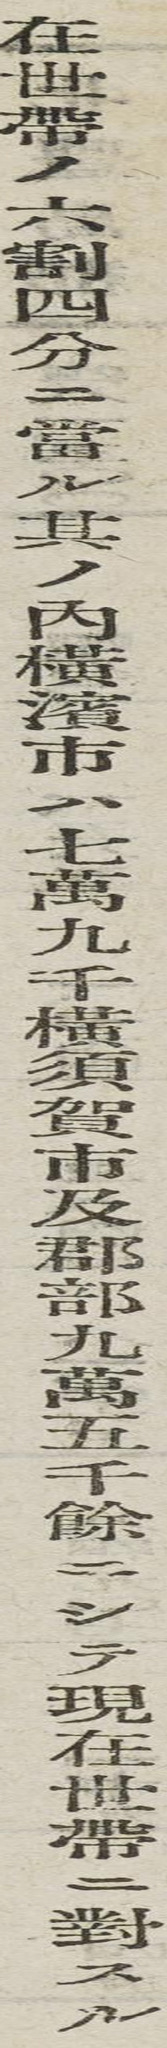在世帯ノ六割四分ニ当ル其ノ内横浜市ハ七万九千横須賀市及郡部九万五千余ニシテ現在世帯ニ対スル
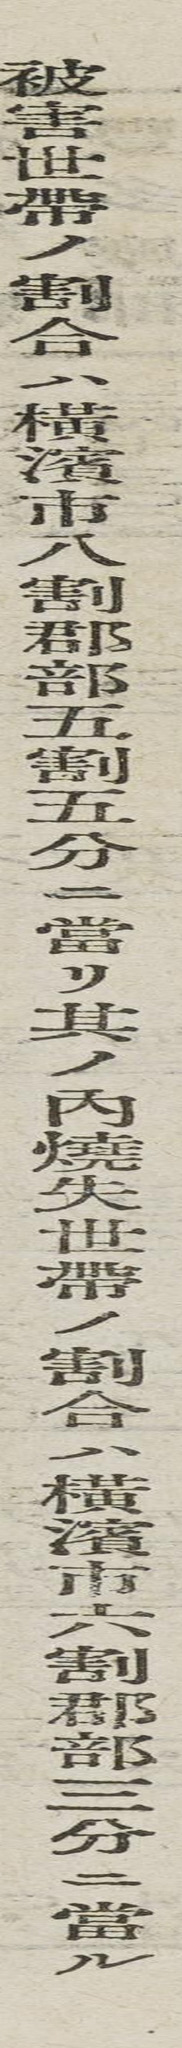被害世帯ノ割合ハ横浜市八割郡部五割五分ニ当リ其ノ内焼失世帯ノ割合ハ横浜市六割郡部三分ニ当ル
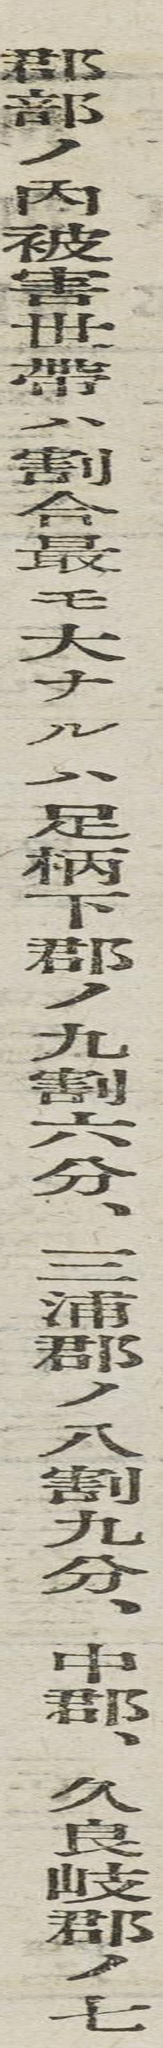郡部ノ内被害世帯ハ割合最モ大ナルハ足柄下郡ノ九割六分、三浦郡ノ八割九分、中郡、久良岐郡ノ七
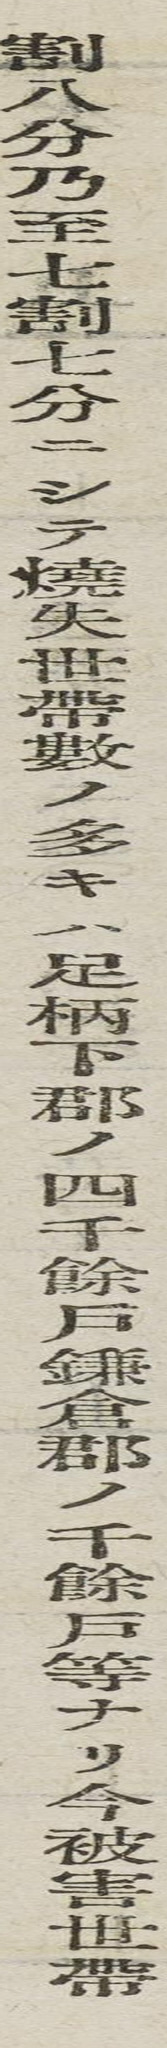割八分乃至七割七分ニシテ焼失世帯数ノ多キハ足柄下郡ノ四千余戸鎌倉郡ノ千余戸等ナリ今被害世帯
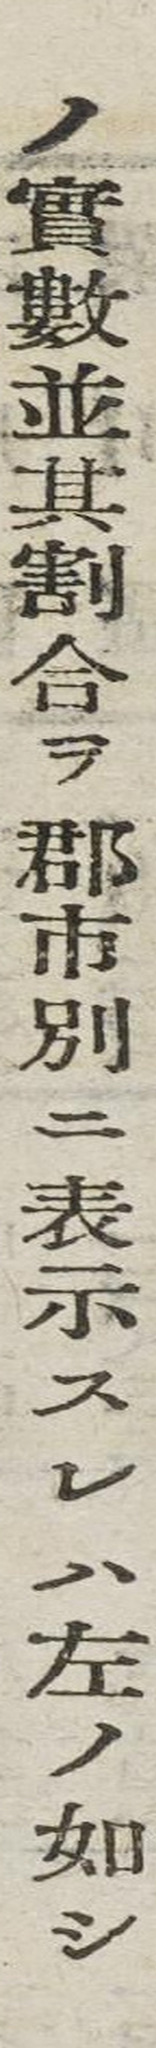ノ実数並其割合ヲ郡市別ニ表示スレハ左ノ如シ
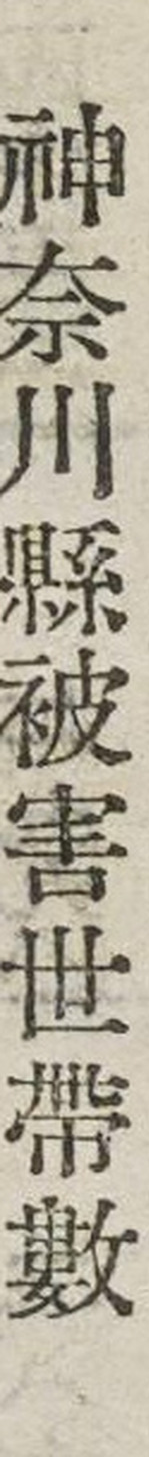神奈川県被害世帯数
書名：震災被害状況並救護施設概要
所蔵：東京大学地震研究所図書室 Earthquake Research Institute Library, The University of Tokyo, JAPAN
